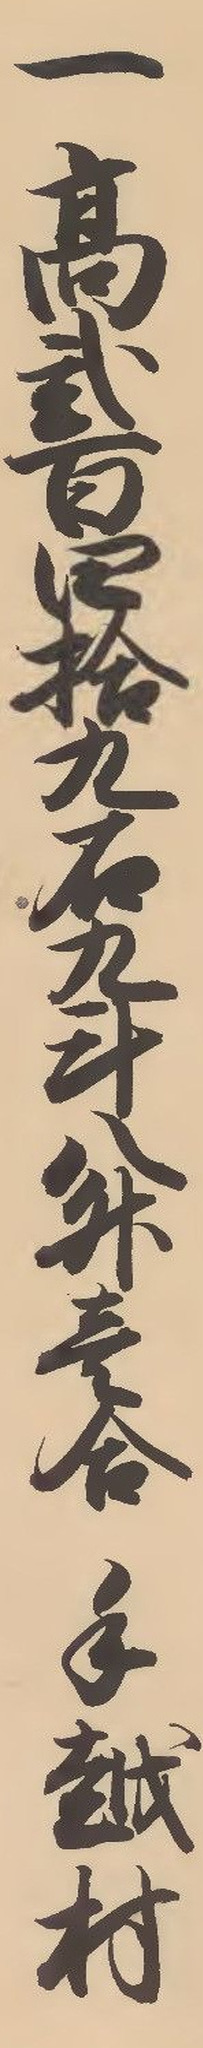一高弐百四拾九石九斗八升壱合手越村
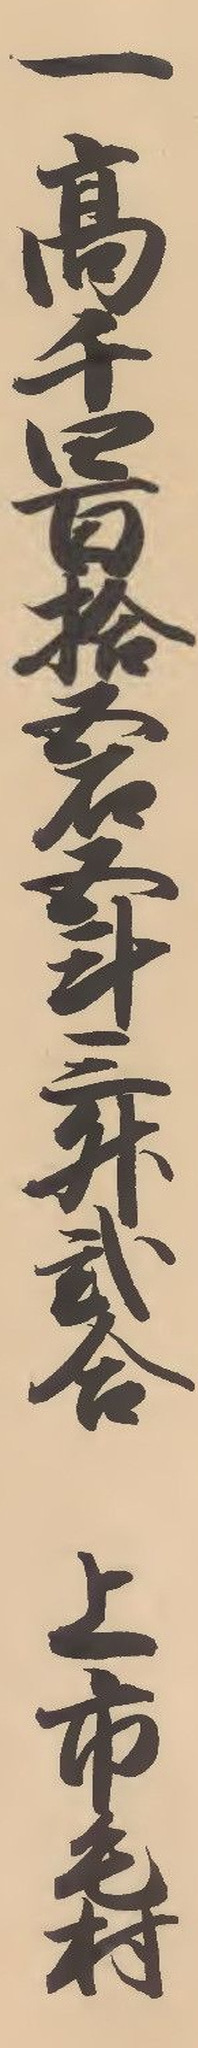一高千四百拾五石五斗三升弐合上市毛村
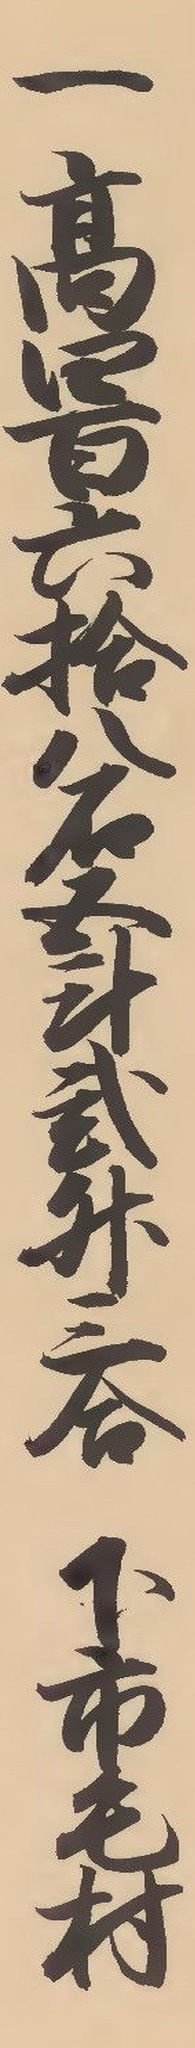一高四百六拾八石五斗弐升三合下市毛村
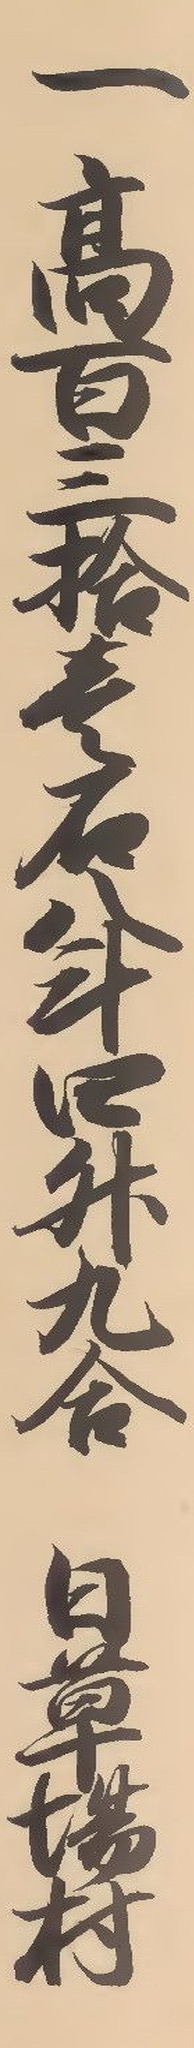一高百三拾壱石八斗四升九合日草場村
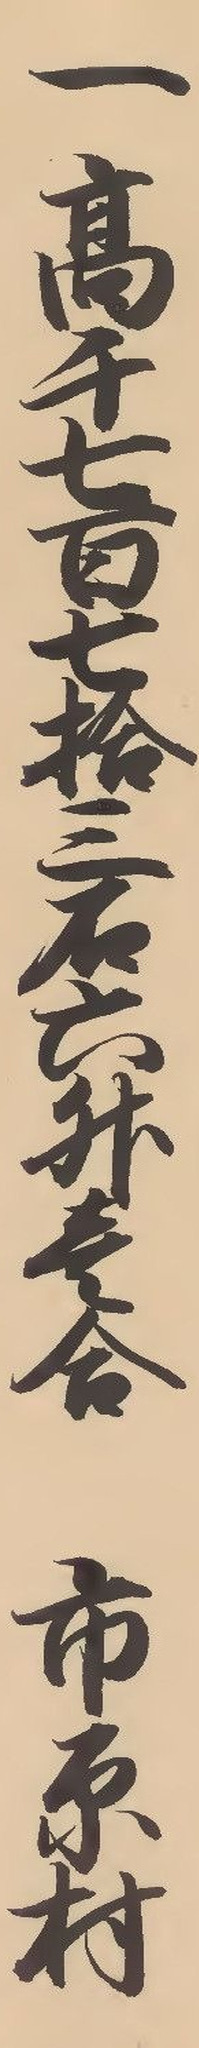一高千七百七拾三石六升壱合市原村
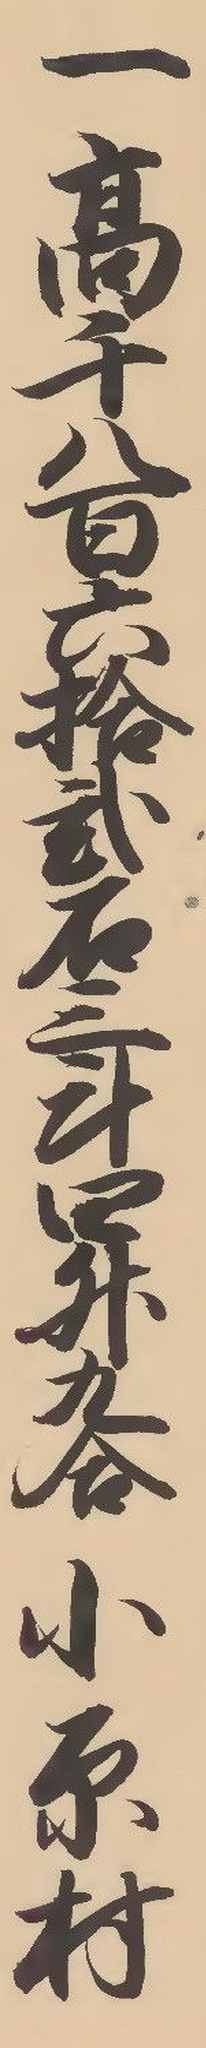一高千八百六拾弐石三斗四升九合小原村
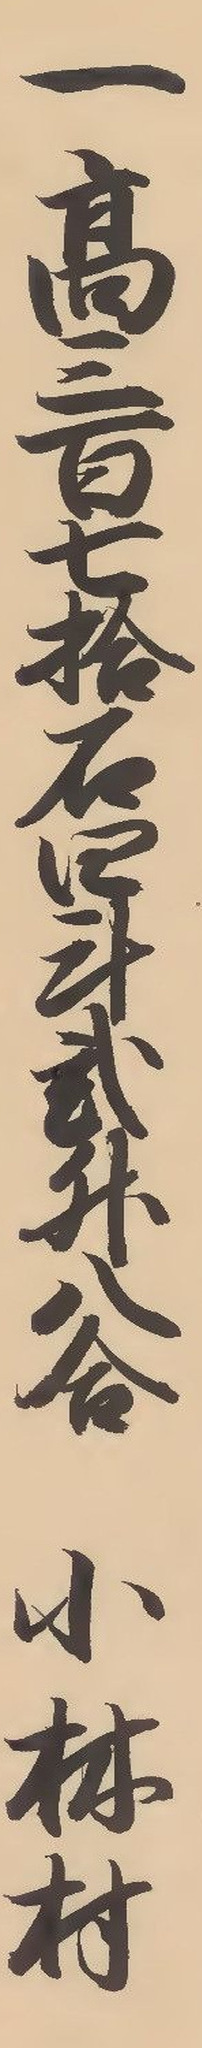一高三百七拾石四斗弐升八合小林村

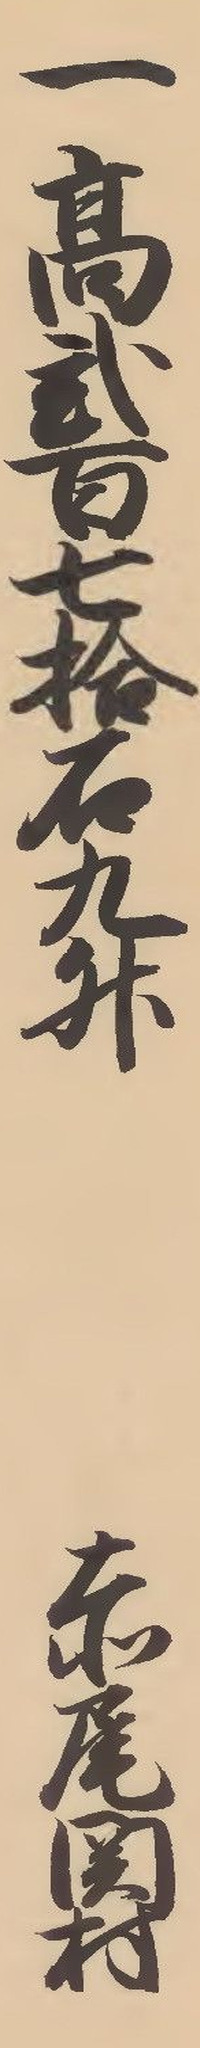一高弐百七拾石九升赤尾関村
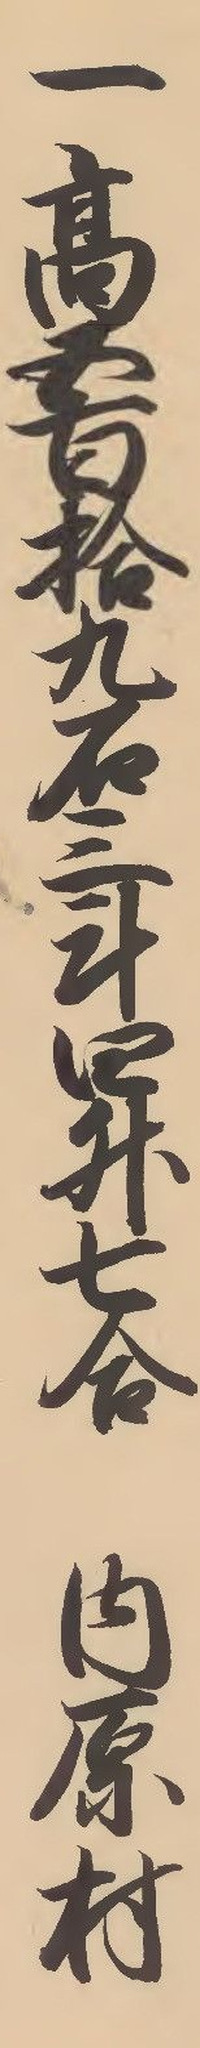一高五百拾九石三斗四升七合内原村
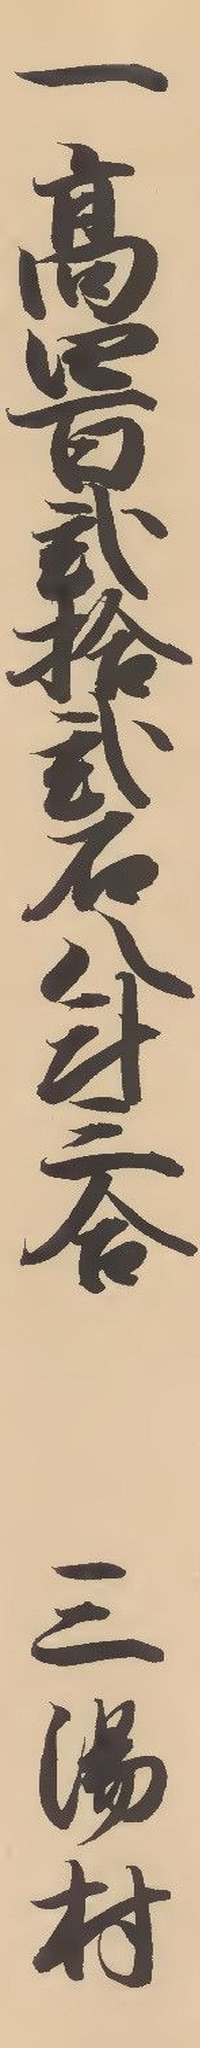一高四百弐拾弐石八斗三合三湯村
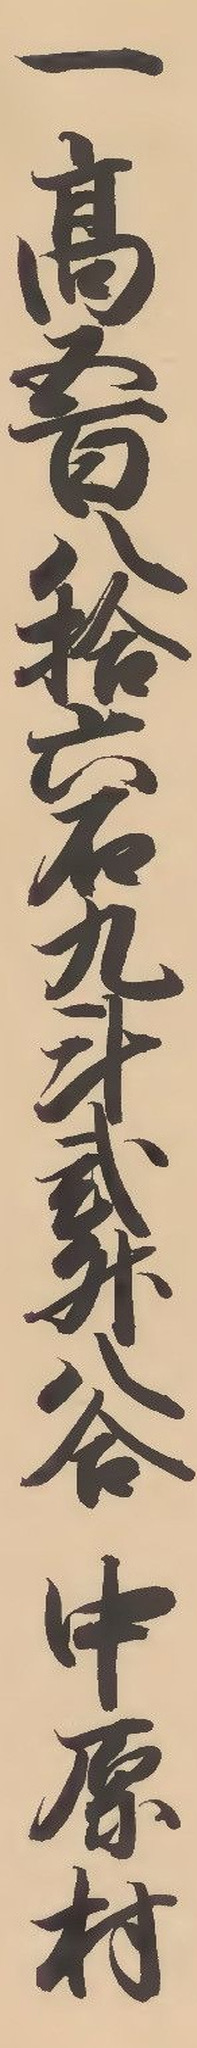一高五百八拾六石九斗弐升八合中原村
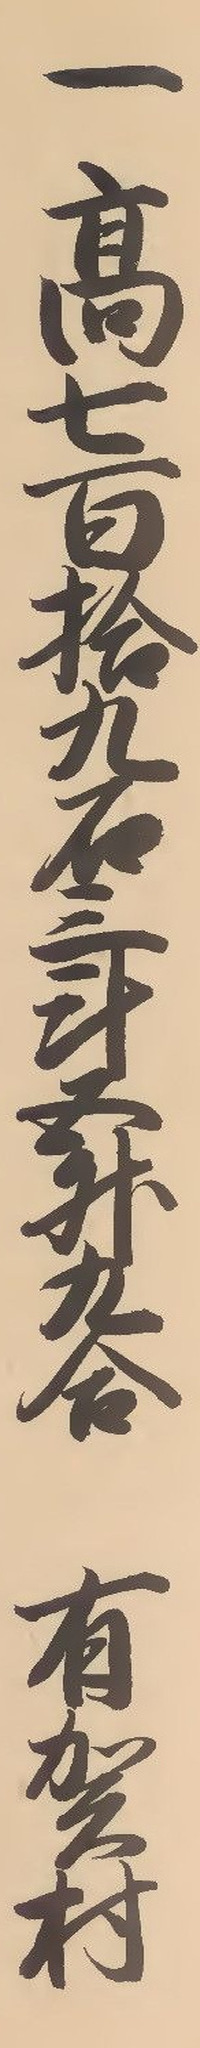一高七百拾九石三斗五升九合有賀村
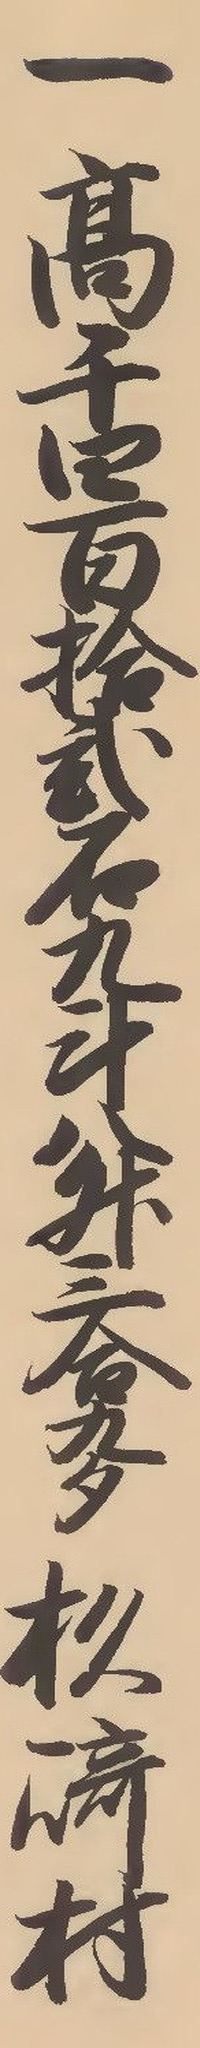一高千四百拾弐石九斗八升三合九勺杉崎村
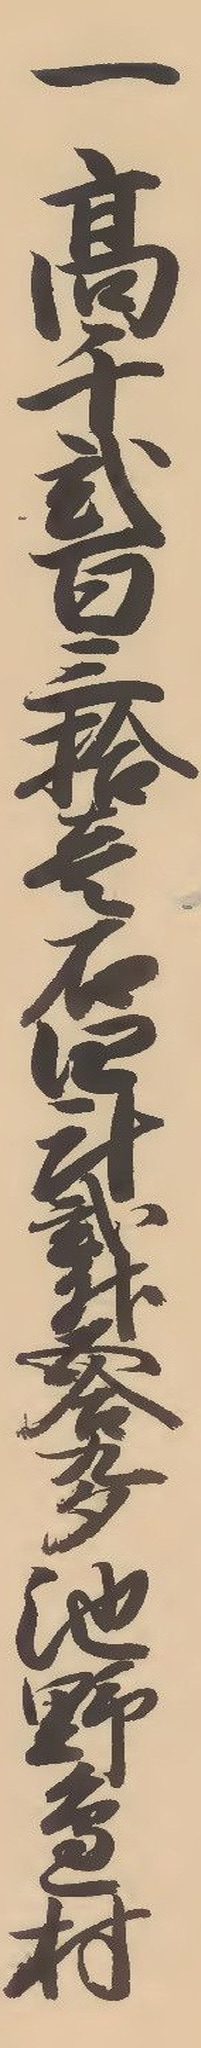一高千弐百三拾壱石四斗弐升五合九勺池野辺村
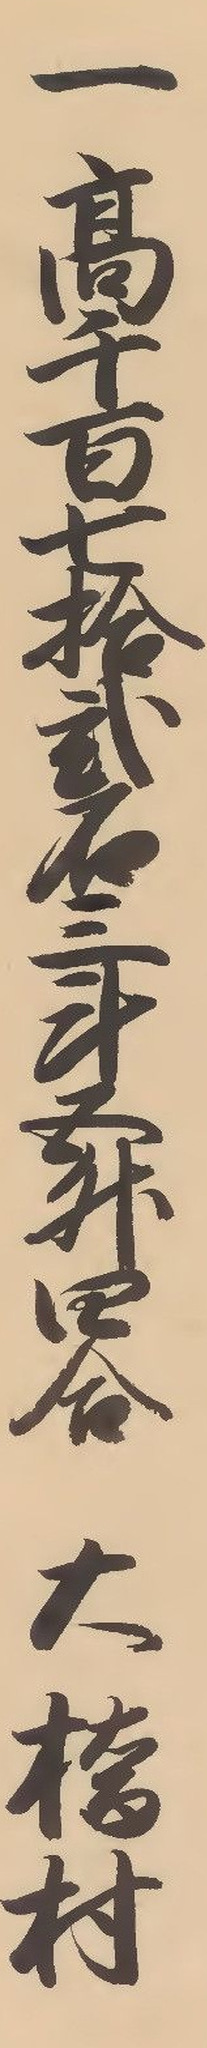一高千百七拾弐石三斗五升四合大橋村

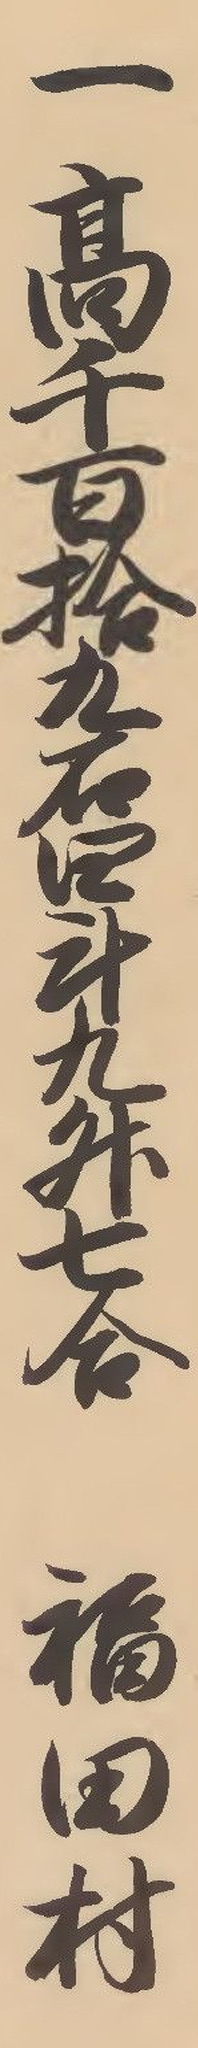一高千百拾九石四斗九升七合福田村
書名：常陸国郷帳
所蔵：国立公文書館 National Archives of Japan
